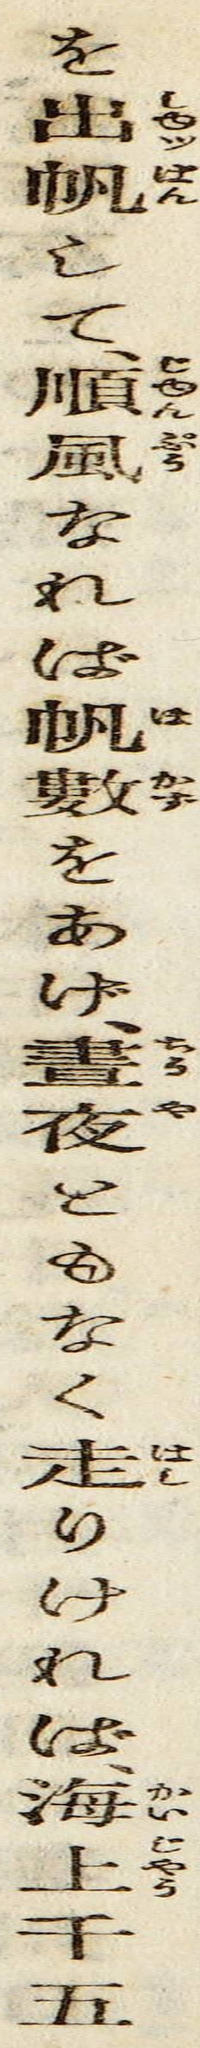を出帆して、順風なれば帆数をあげ、昼夜ともなく走りければ、海上千五
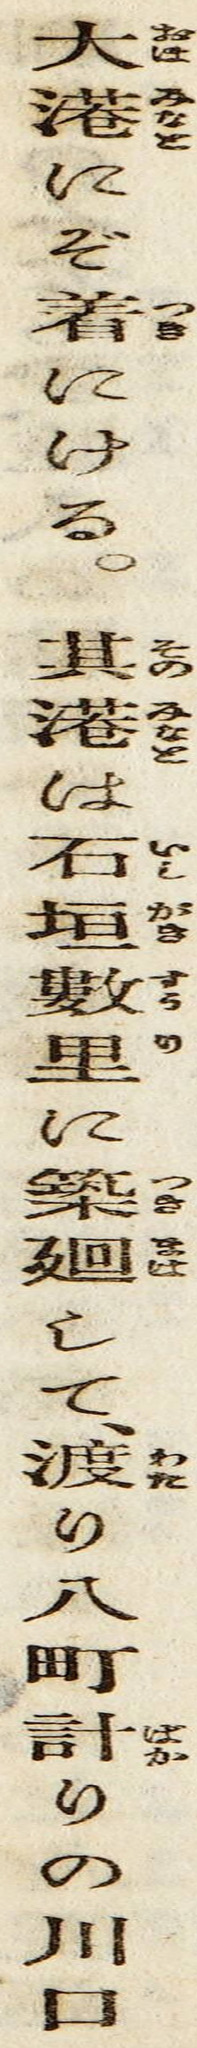大港にぞ着にける。其港は石垣数里に築廻して、渡り八町計りの川口
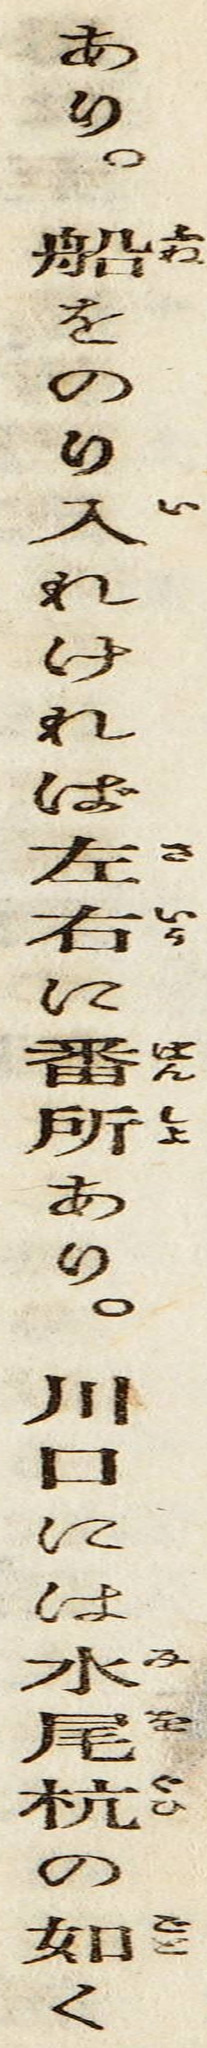あり。船をのり入れければ左右に番所あり。川口には水尾杭の如く
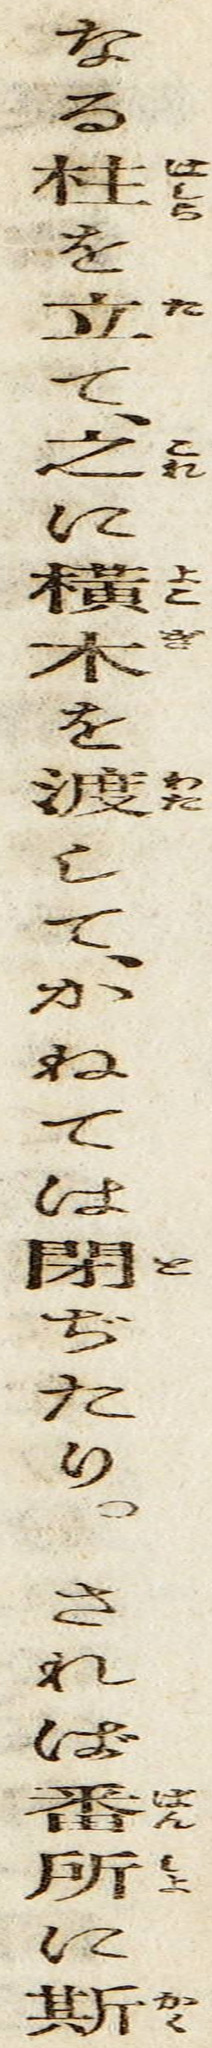なる柱を立て、之に横木を渡して、かねては閉ぢたり。されば番所に斯
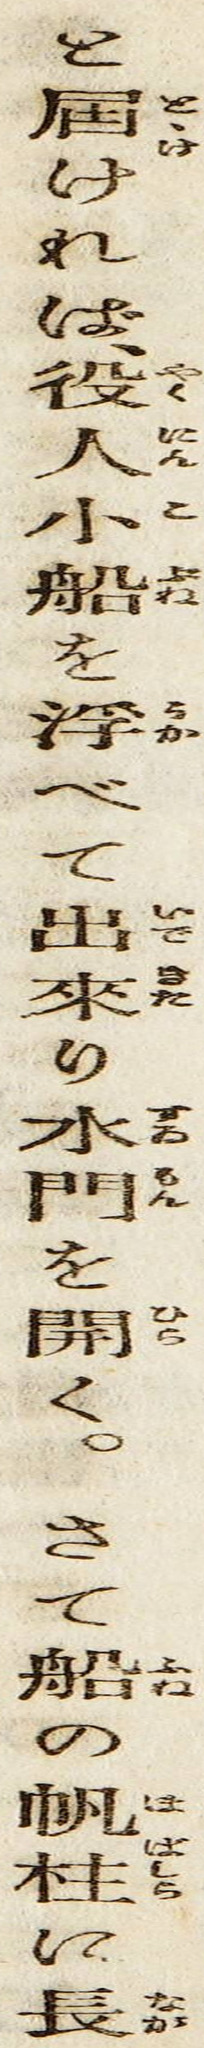と届ければ、役人小船を浮べて出来り水門を開く。さて船の帆柱に長
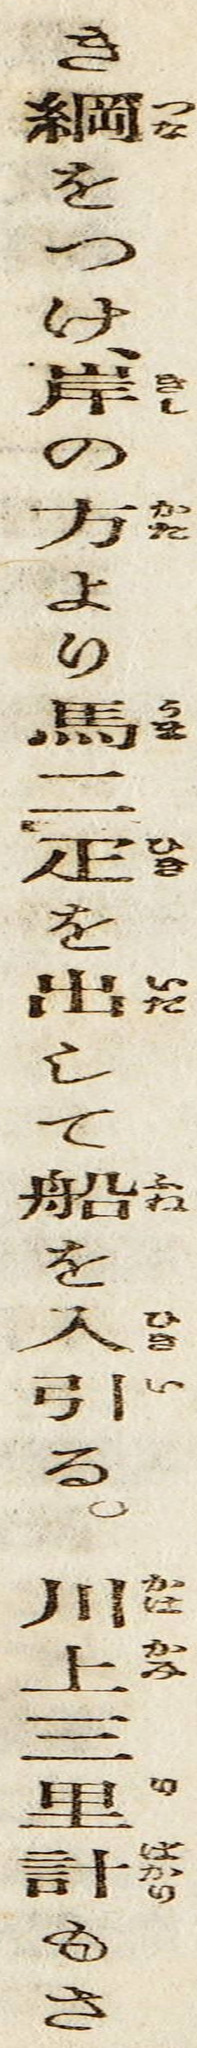き綱をつけ、岸の方より馬二疋を出して船を入引る。川上三里計もさ
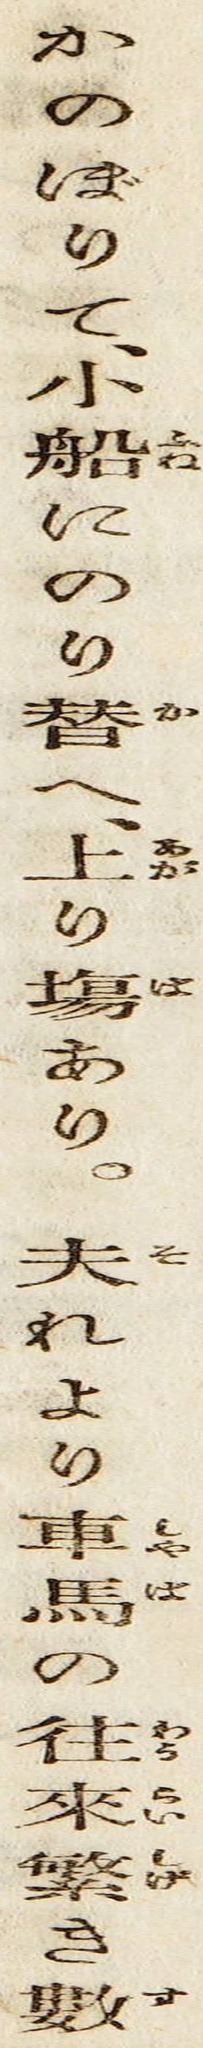かのぼりて、小船にのり替へ、上り場あり、夫れより車馬の往来繁き数
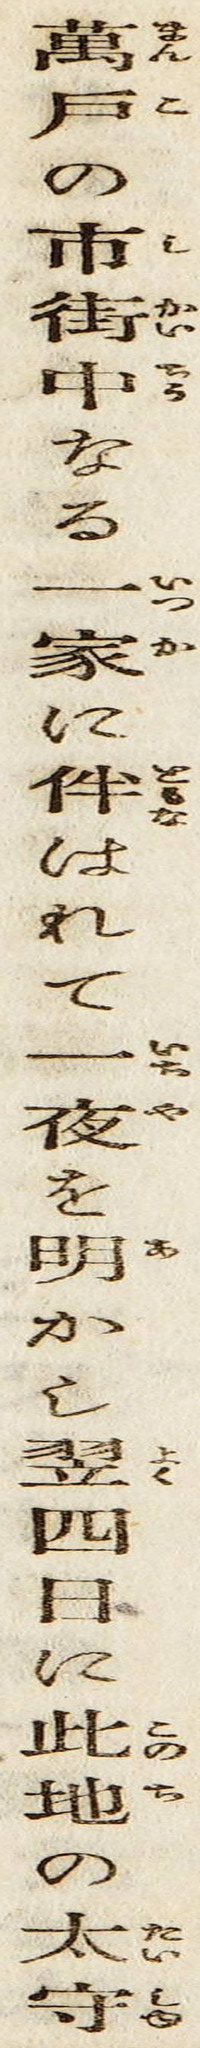万戸の市街中なる一家に伴はれて一夜を明かし翌四日に此地の太守
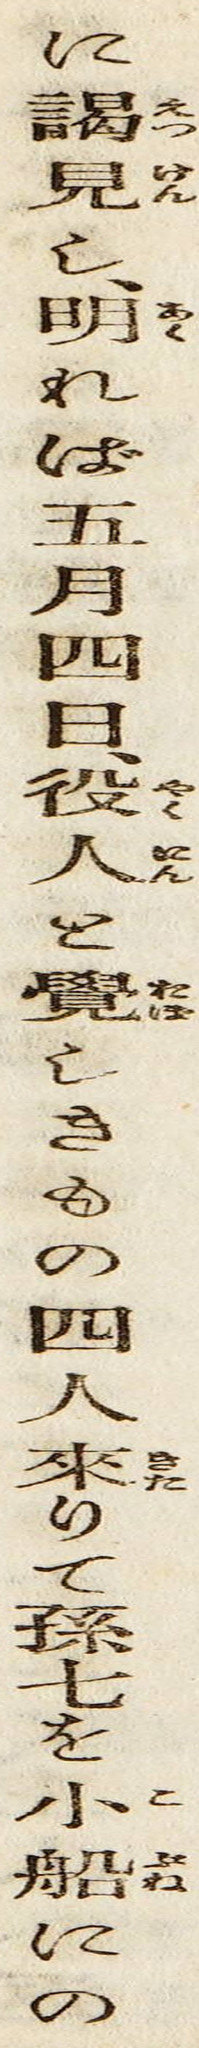に謁見し、明れば五月四日、役人と覚しきもの四人来りて孫七を小船にの
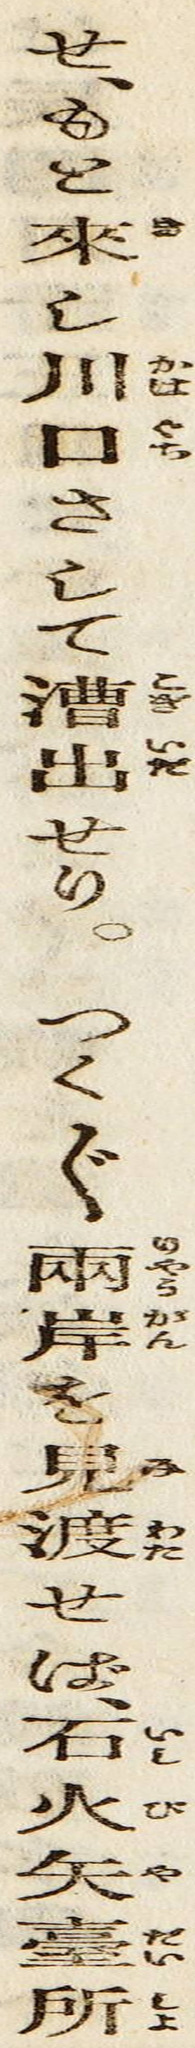せ、もと来し川口さして漕出せり。つく〴〵両岸を見渡せば、石火矢台所
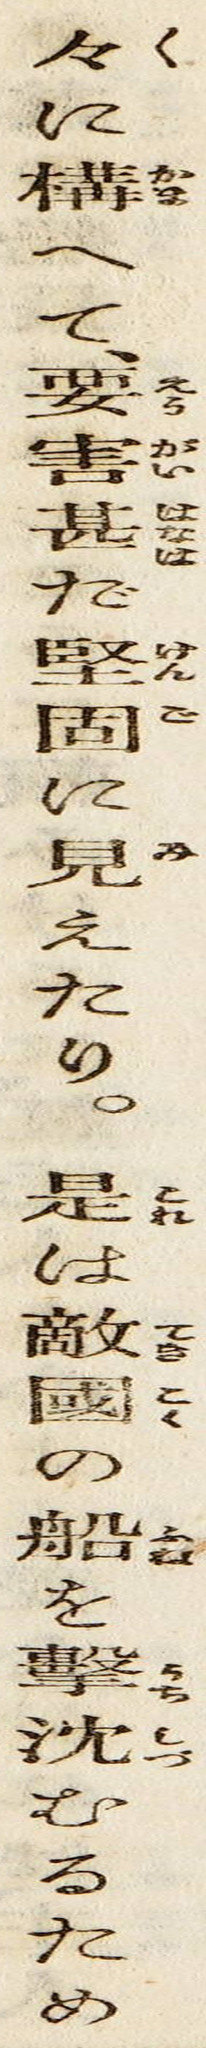々に構へて、要害甚だ堅固に見えたり。是は敵国の船を撃沈むるため
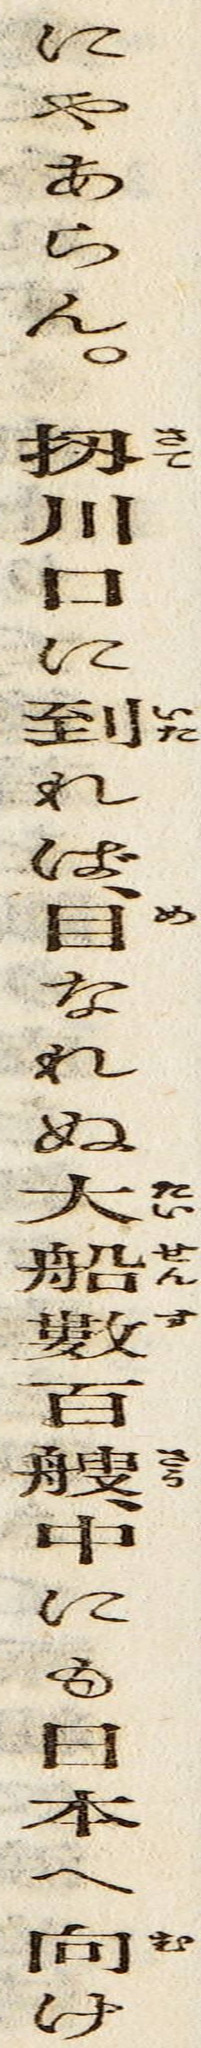にやあらん。扨川口に到れば、目なれぬ大船数百艘、中にも日本へ向け
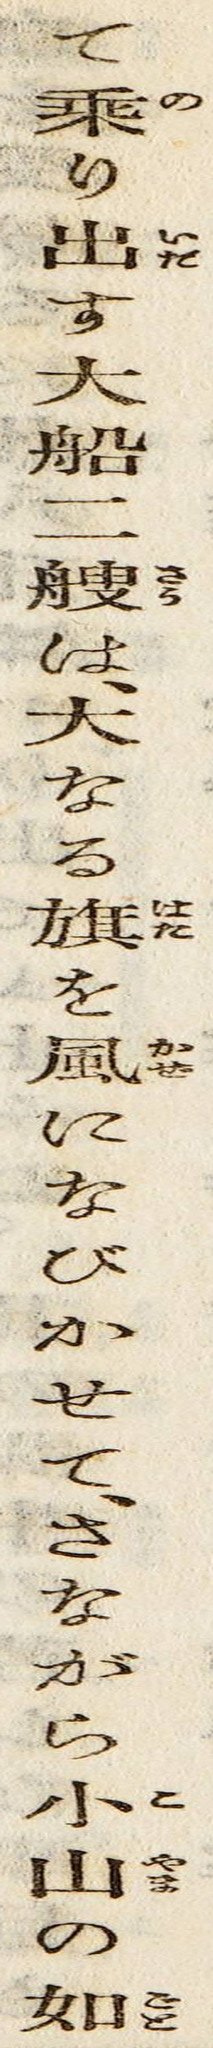て乗り出す大船二艘は、大なる旗を風になびかせて、さながら小山の如
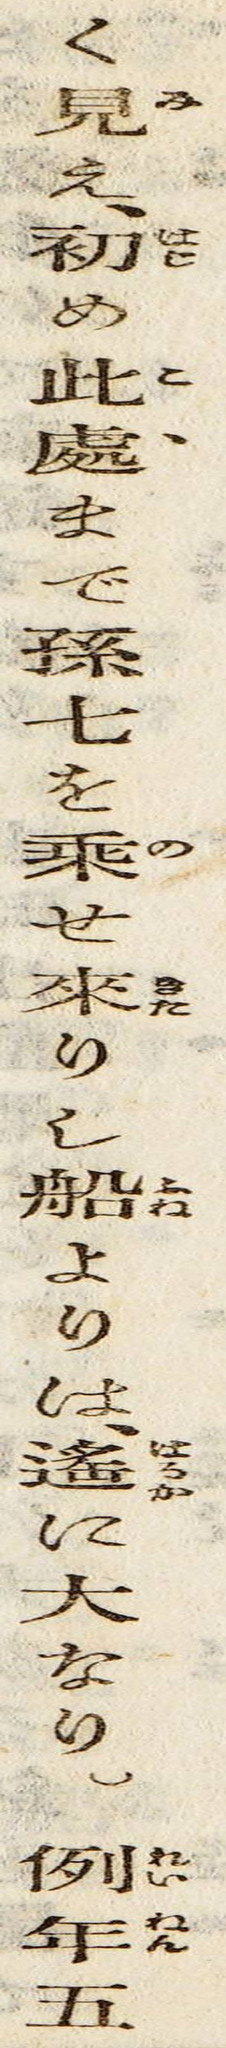く見え、初め此処まで孫七を乗せ来りし船よりは、遥に大なり。例年五
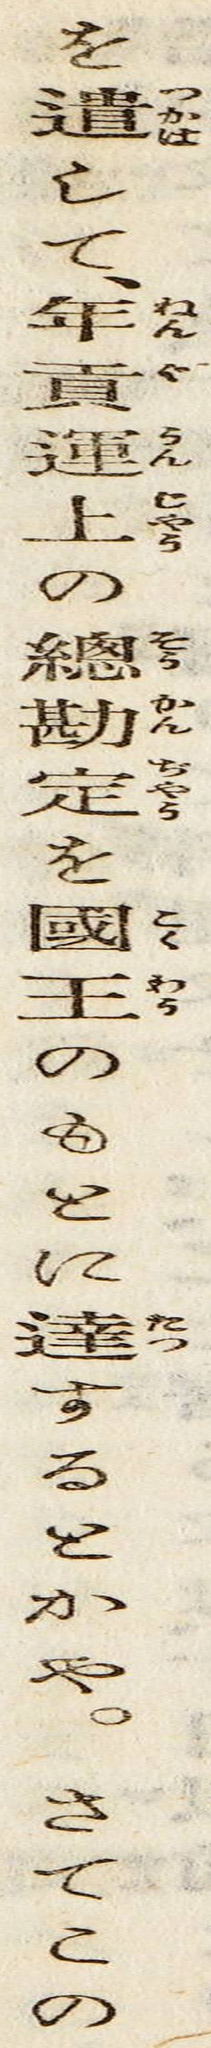を遣して、年貢運上の総勘定を国王のもとに達するとかや。さてこの
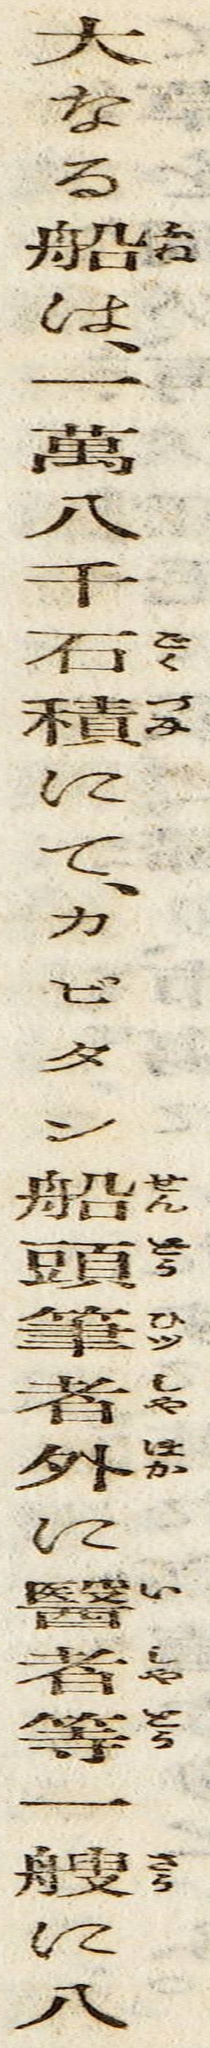大なる船は、一万八千石積にて、カピタン船頭筆者外に医者等一艘に八
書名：日本漂流譚
